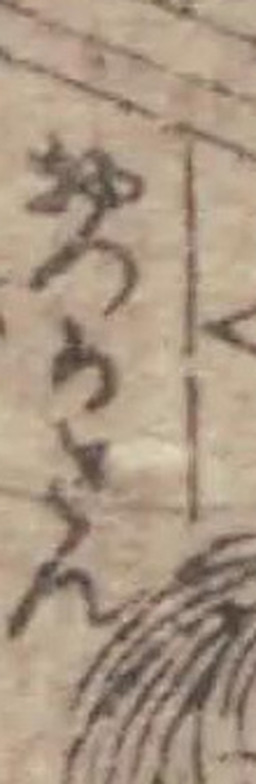おつかさん
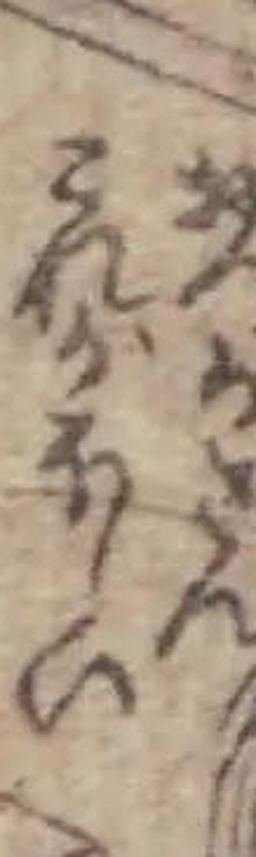これがほしい
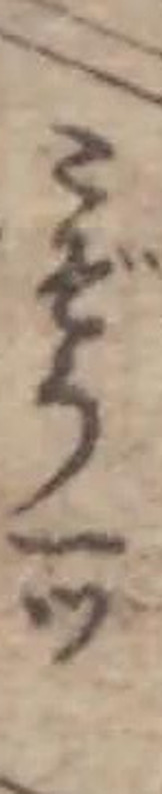こぞう一ツ
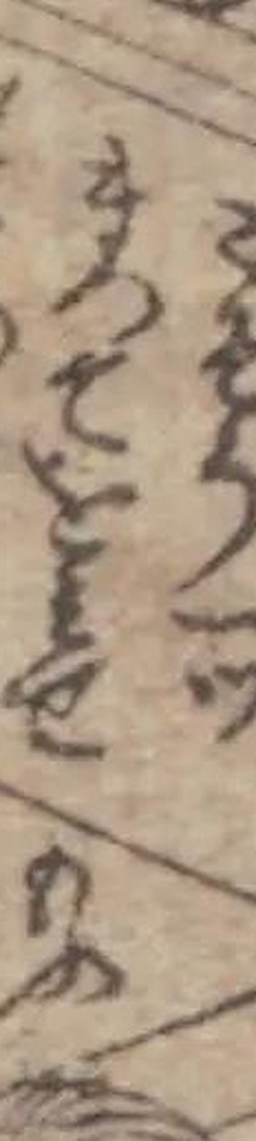まつてをミせもふ
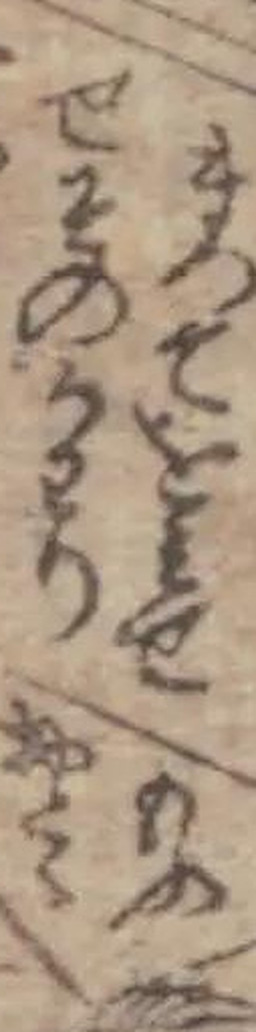せそのかわりとおとゝ
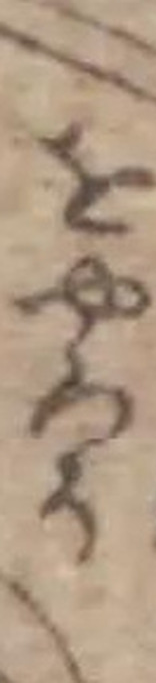をやろう
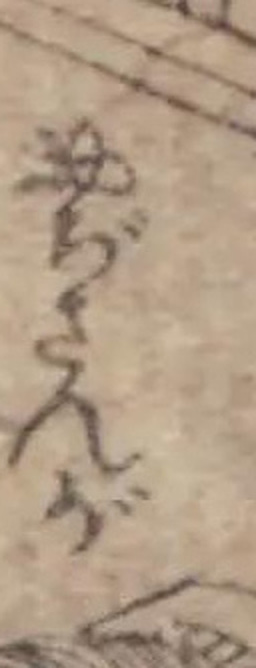おぢさんが
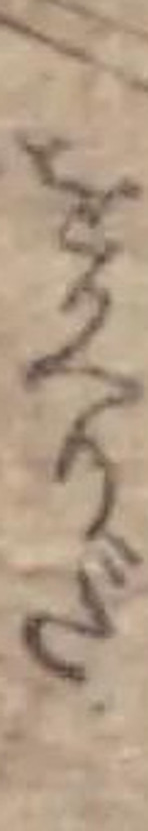をかへりだ
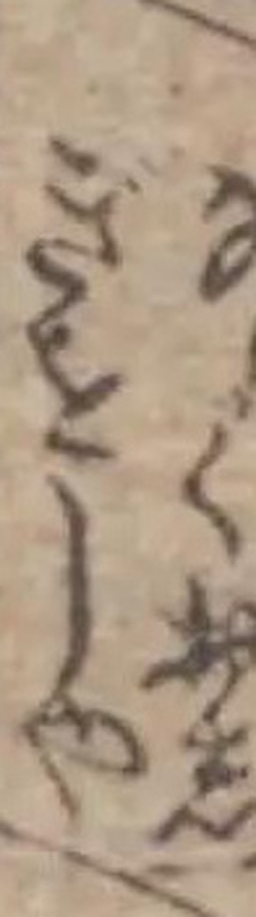ぎをしや
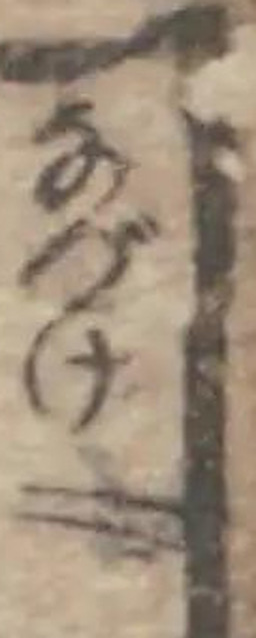なづけ
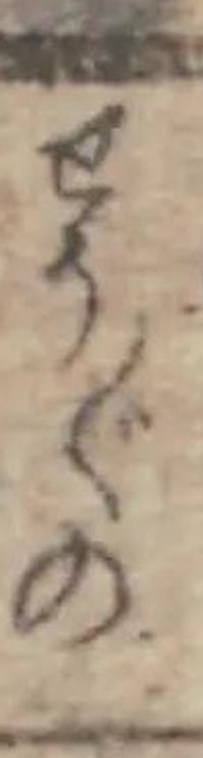せう〴〵の
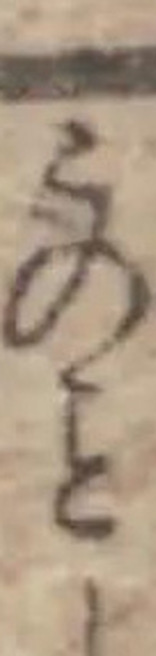このこと
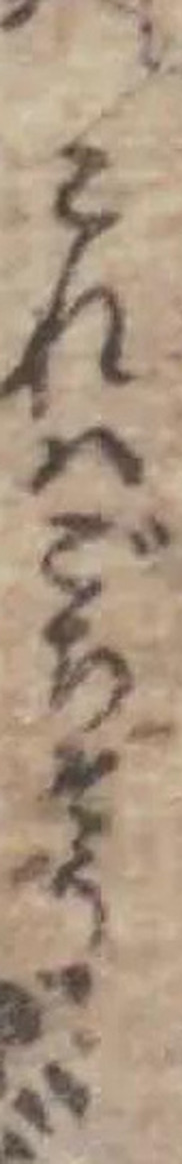これハごちそう
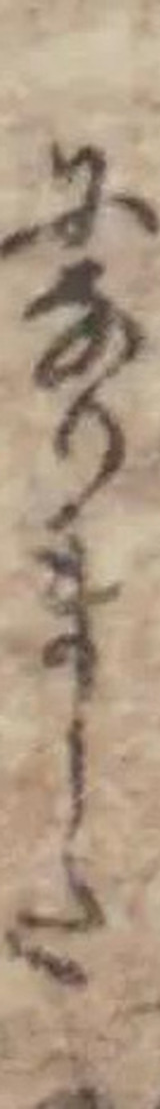になりました
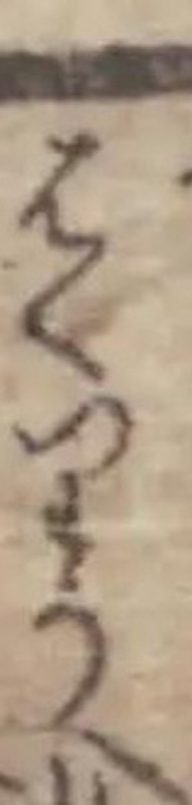はくりう
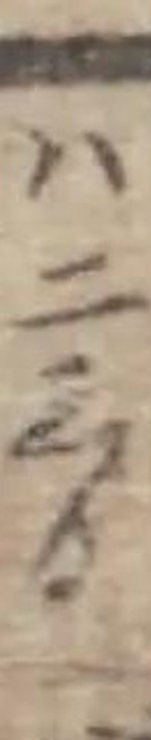ハ二三日
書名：草紙の曙 3巻
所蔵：国立国会図書館 National Diet Library, JAPAN
